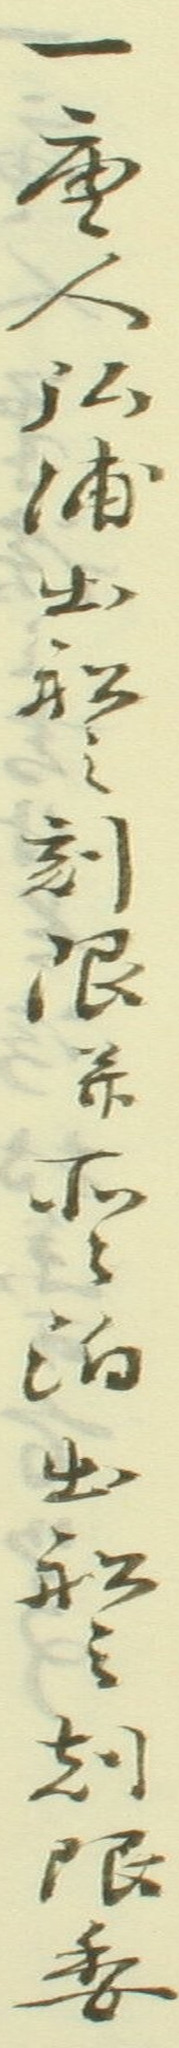一唐人弘浦出船之刻限并所々泊出船之刻限委
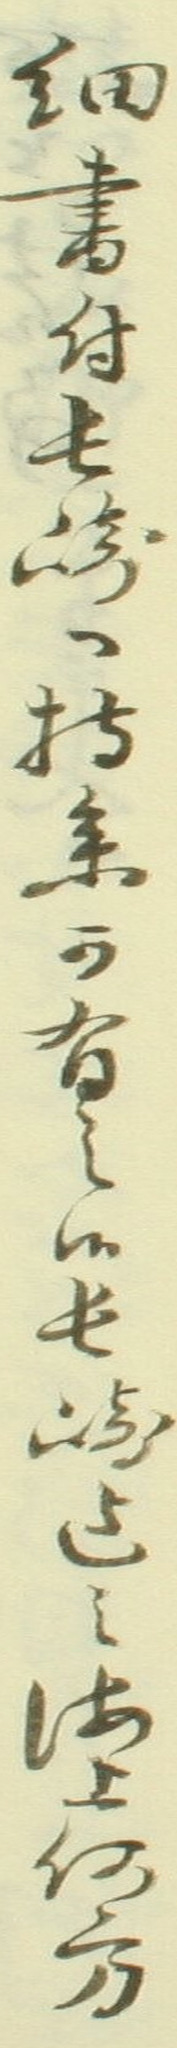細書付長崎へ持参可有之候長崎迄之海上何方
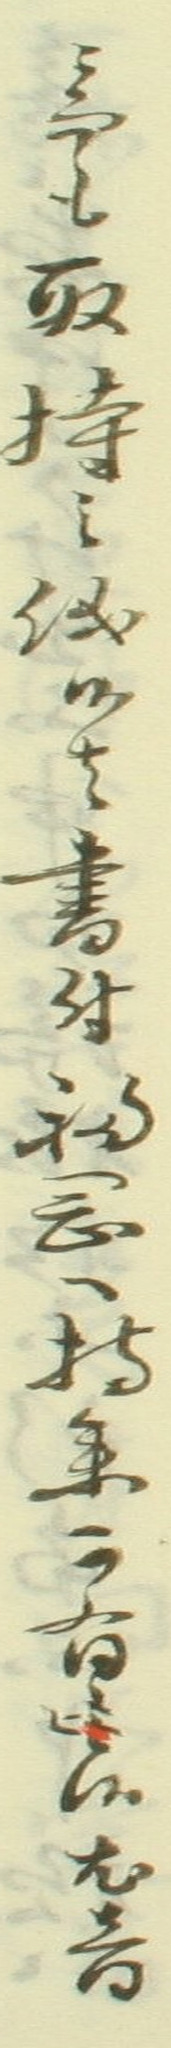に而も取持之儀候は書付福岡へ持参可有之候尤音
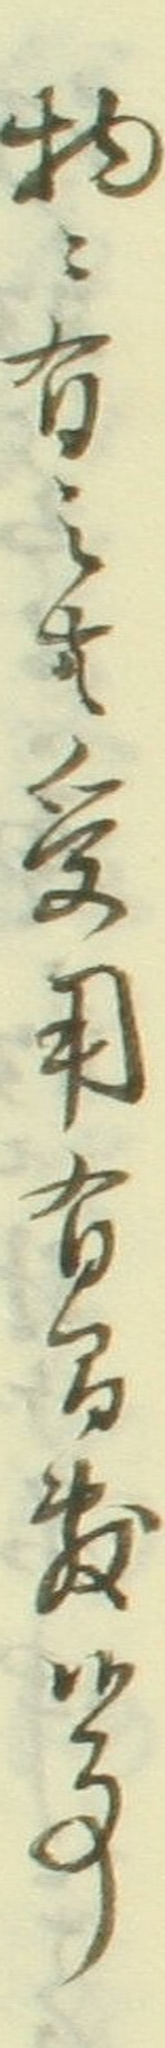物に有之は受用有間敷候事
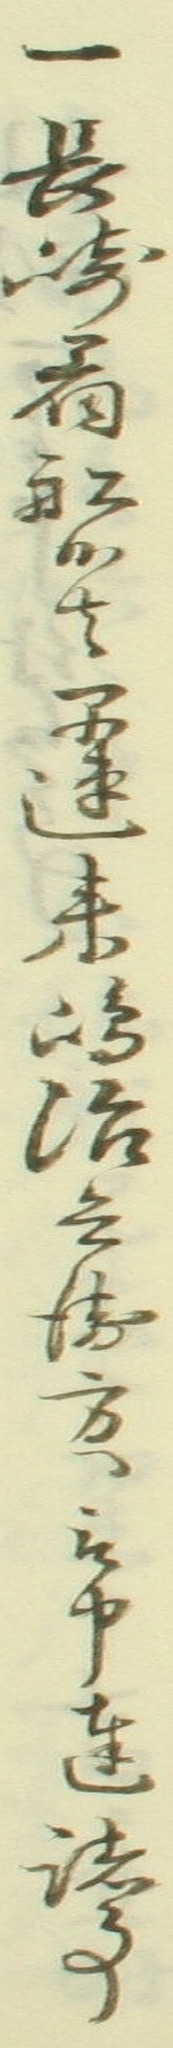一長崎着船候は早速来嶋治兵衛方へ被申達諸事
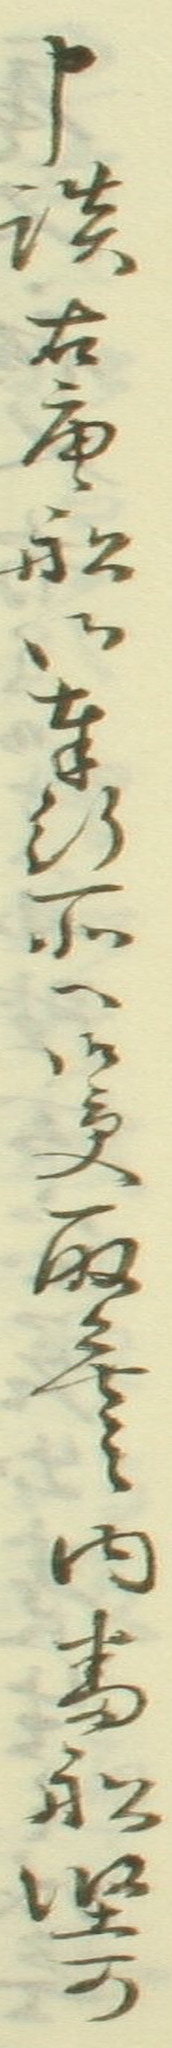申談右唐船御奉行所へ御受取無之内番船堅可
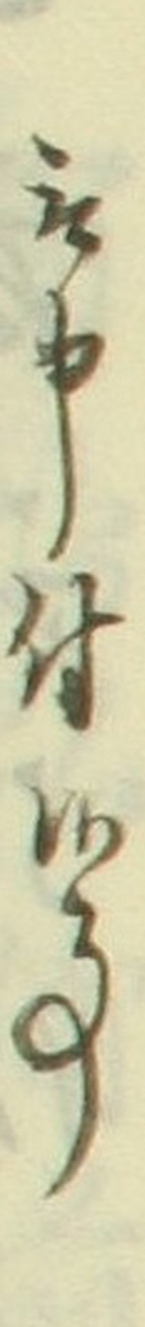被申付候事

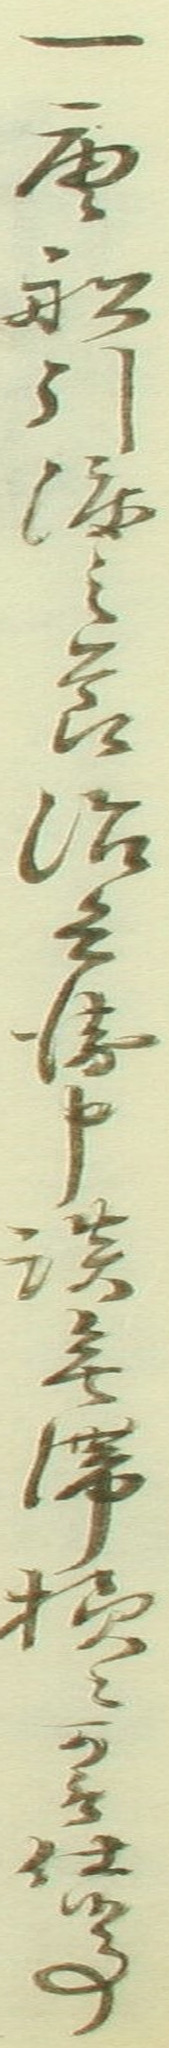一唐船引渡之節治兵衛申談無滞様に可被仕候事
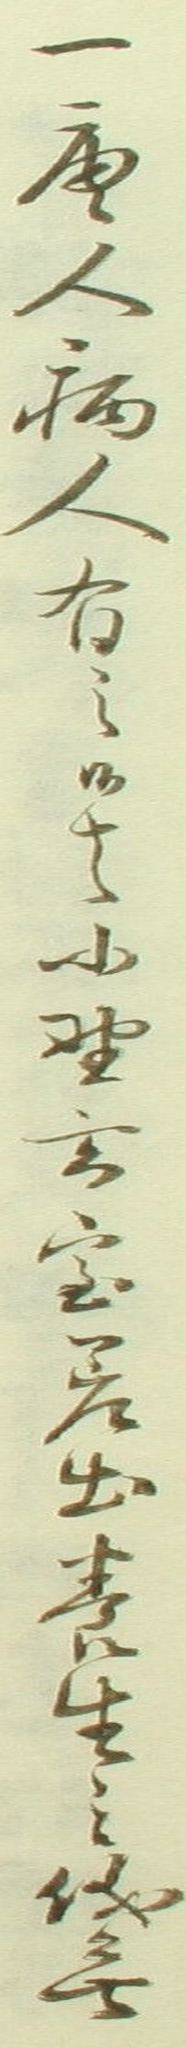一唐人病人有之候は小野玄宝差出養生之儀無
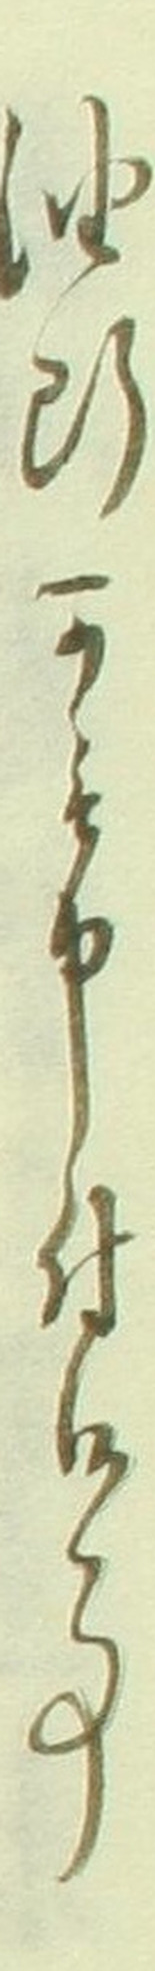油断可被申付候事
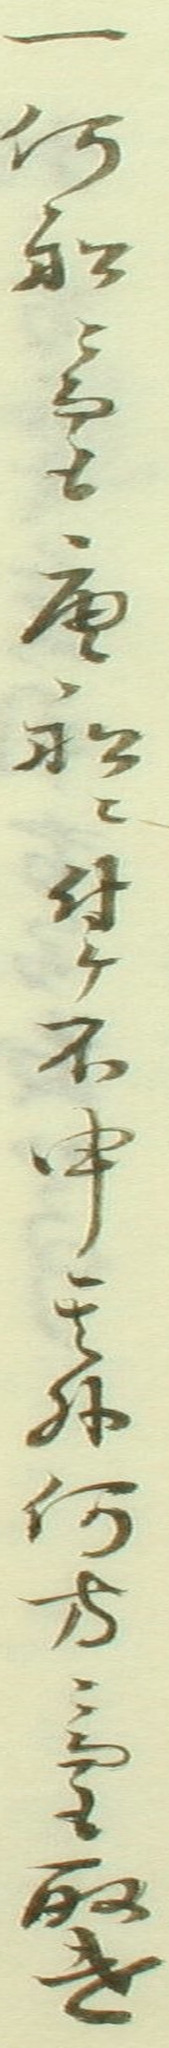一何船に而も唐船に付け不申其外何方に而も取遣
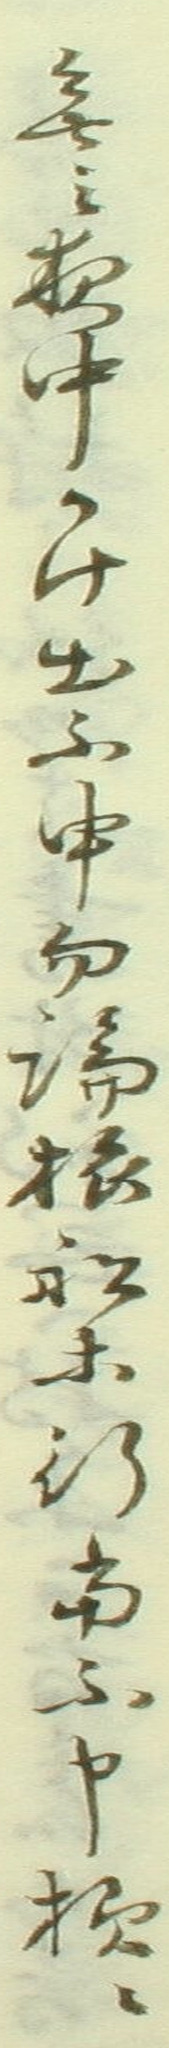無之夜中かけ出不申勿論旅船等行当不申様に
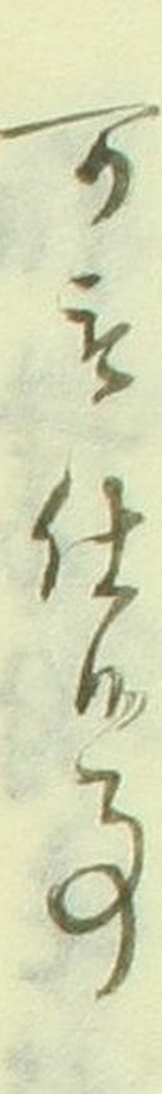可被仕候事
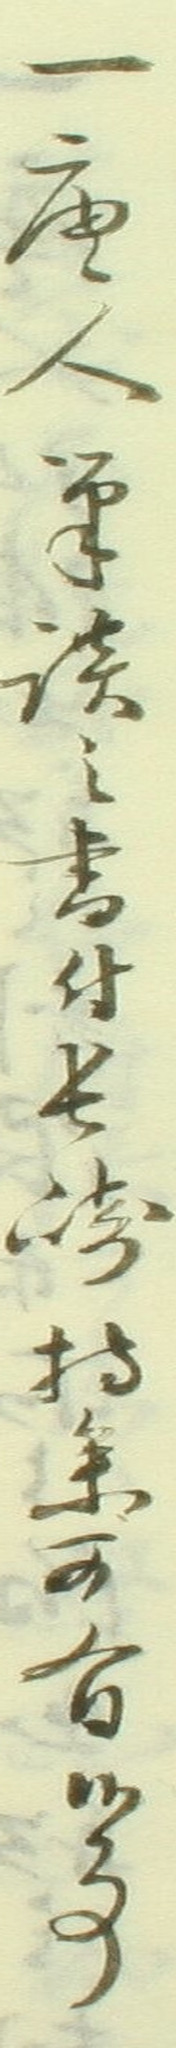一唐人筆談之書付長崎持参可有候事
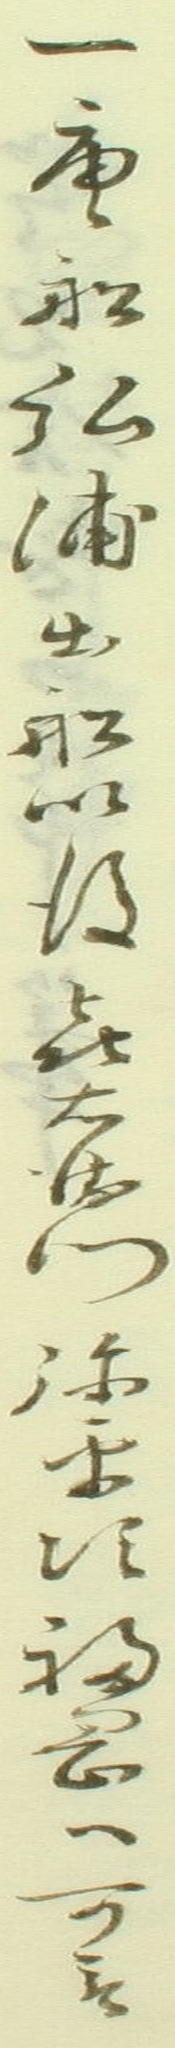一唐船弘浦出船以後喜右衛門弥平時次福岡へ可被
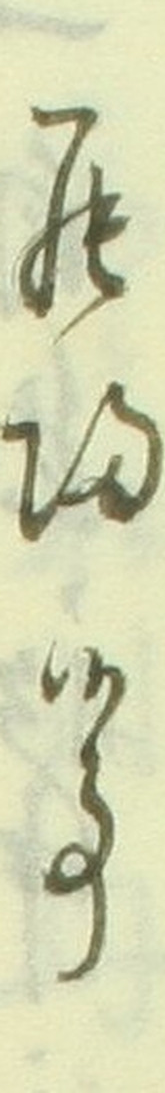罷帰候事
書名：異国船漂着記
